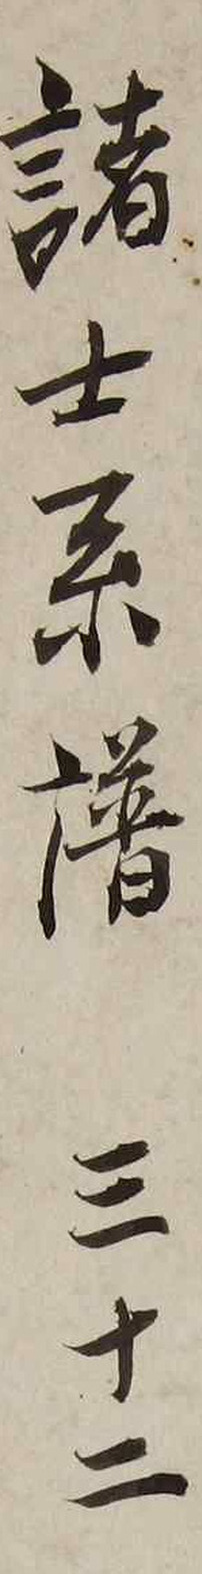諸士系譜三十三

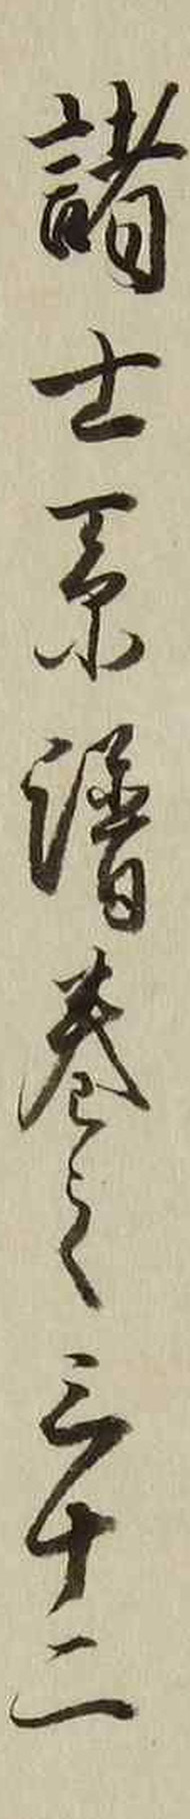諸士系譜巻之三十二
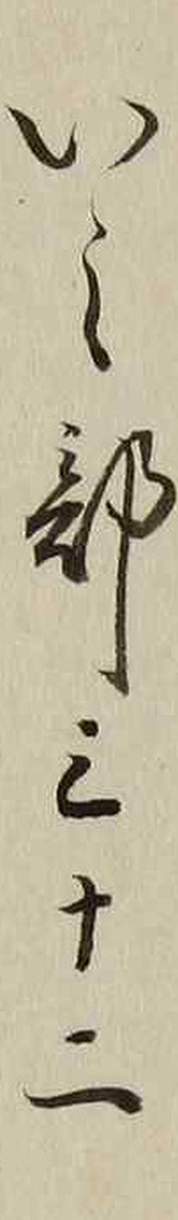い之部三十二
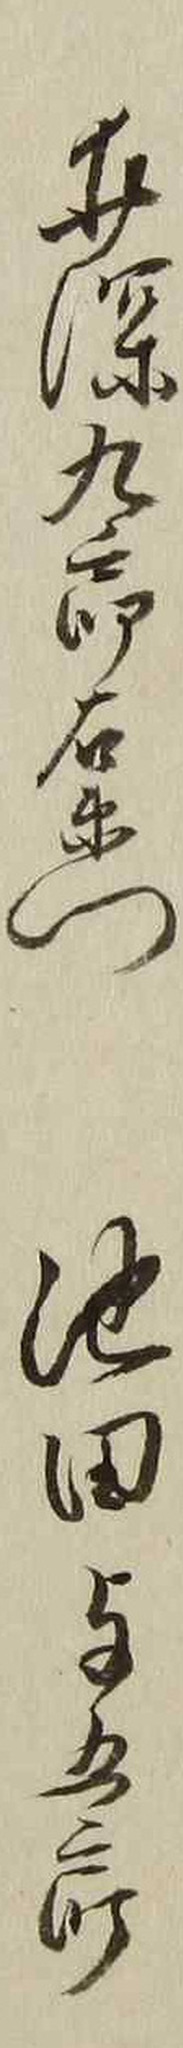井深九郎右衛門池田与五郎
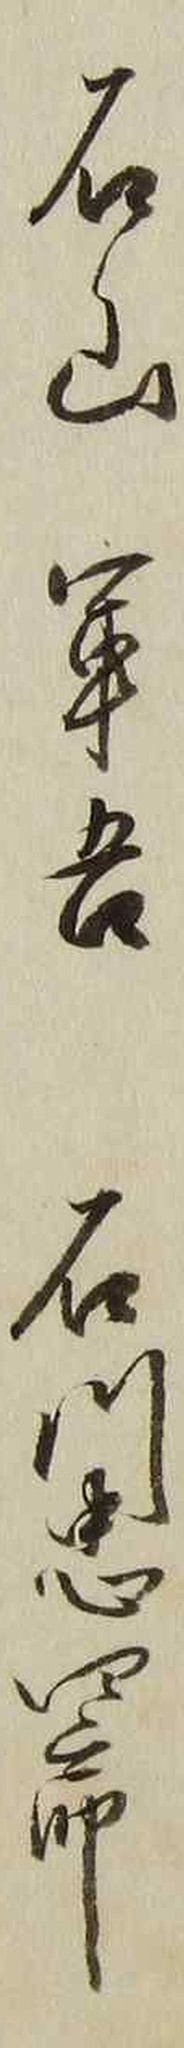石山軍吾石川忠四郎

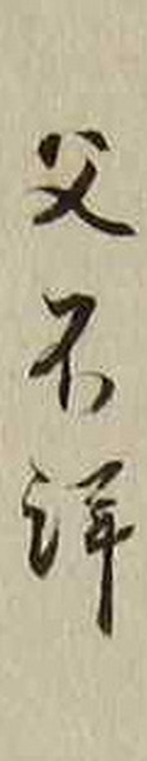父不詳
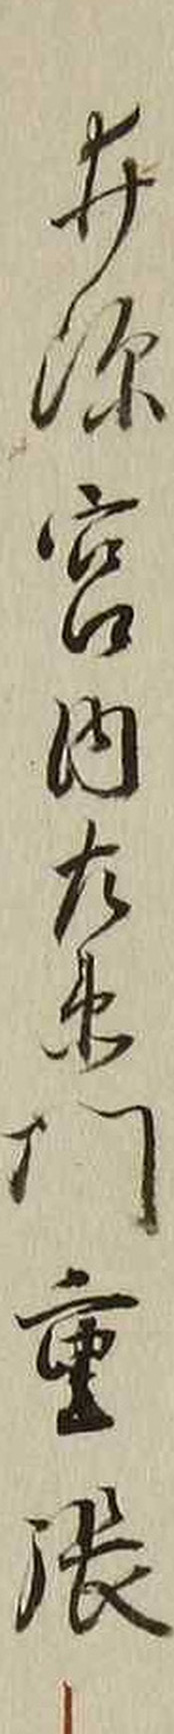井深宮内左衛門重張
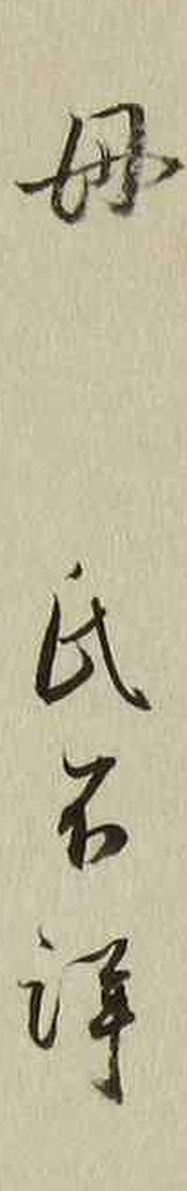母氏不詳
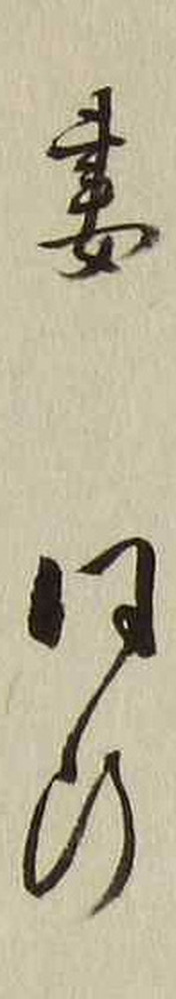妻同断
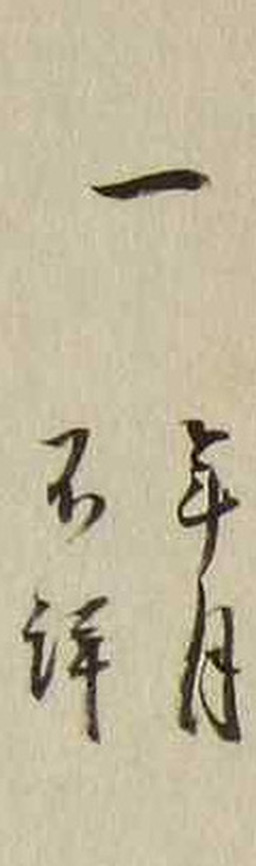父不詳
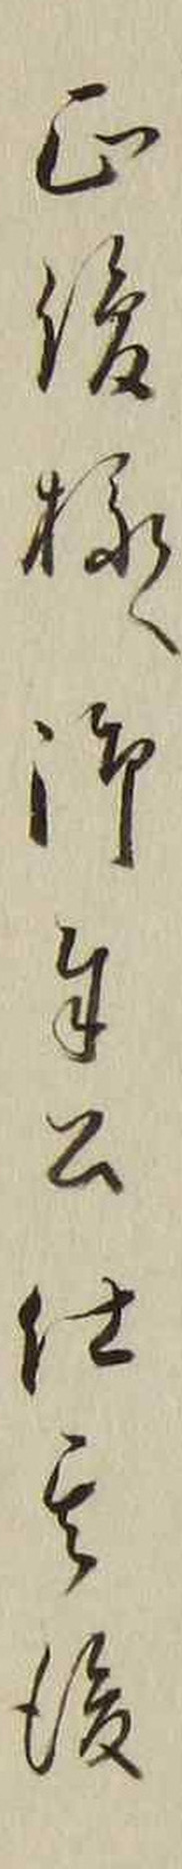正俊様へ御奉公仕其後

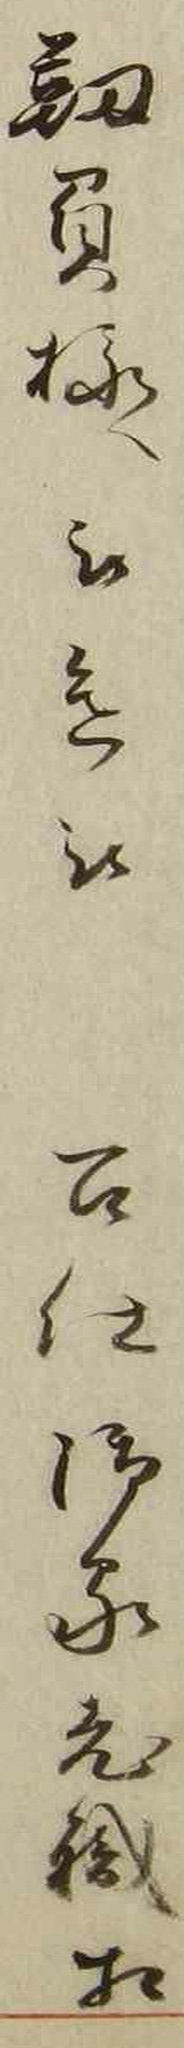靱負様へ被進被召仕御家老職相
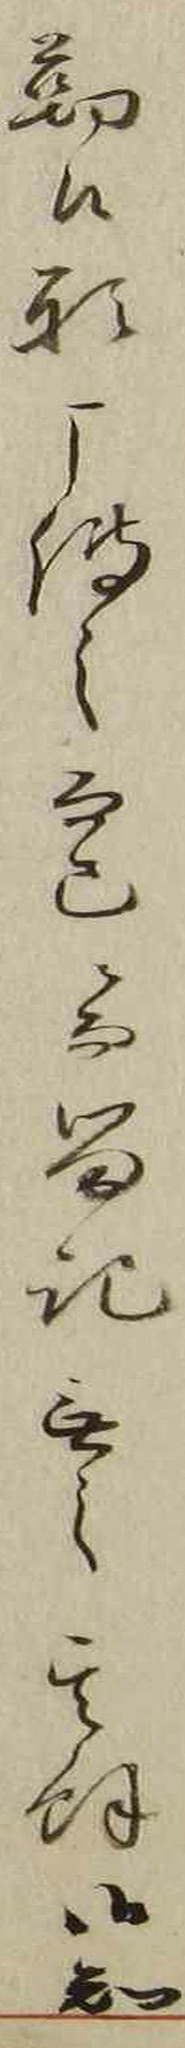勤候願申伝之而已ニ而留記無之其餘御知
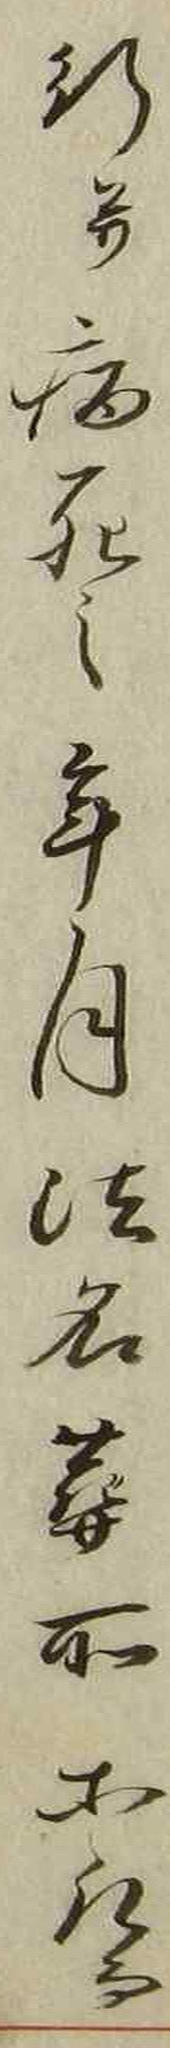行幷病死之年月法名葬所等凡而
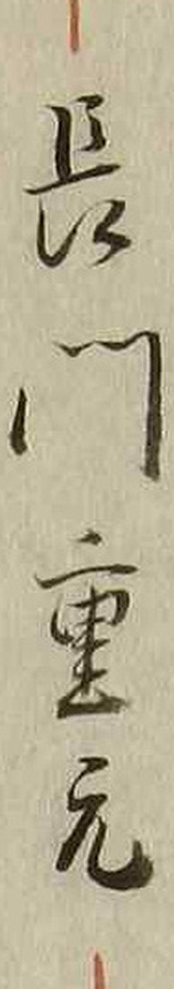長門重元
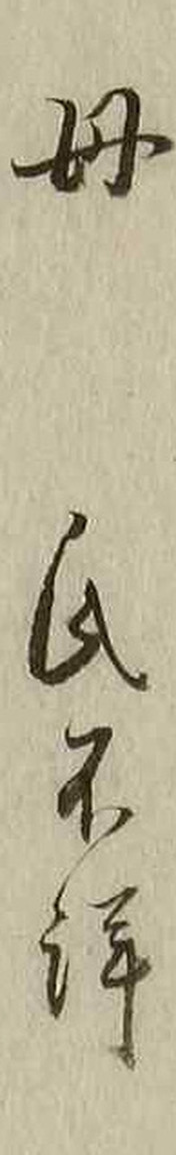母氏不詳
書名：諸士系譜　巻之32　い之部32
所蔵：会津若松市立会津図書館
